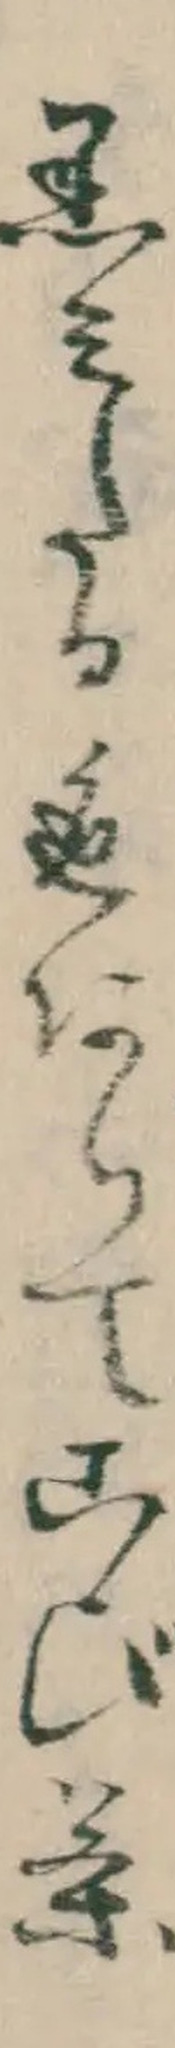黒みたる色ありてこび茶
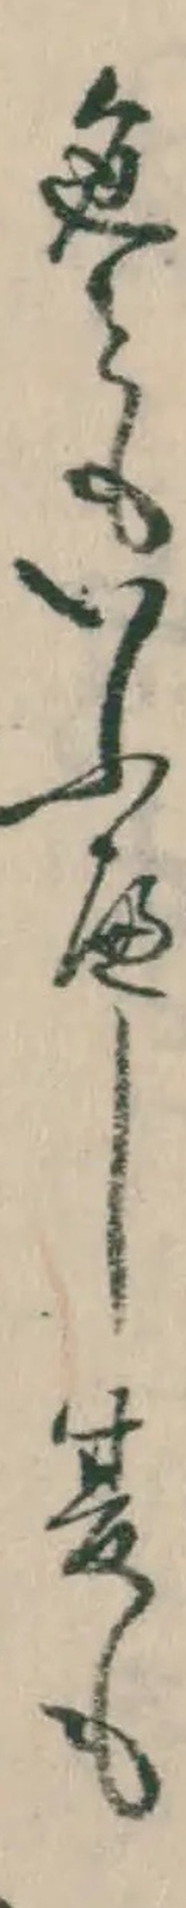色ともいふへし夏も
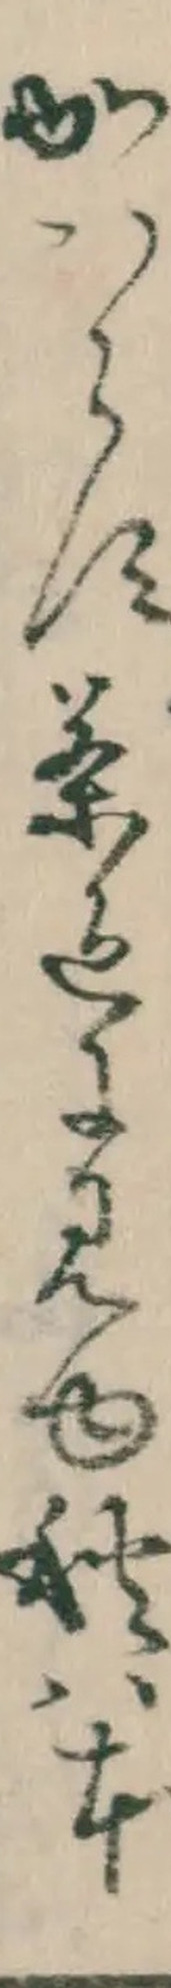かはらす茶色に見ゆ秋は本
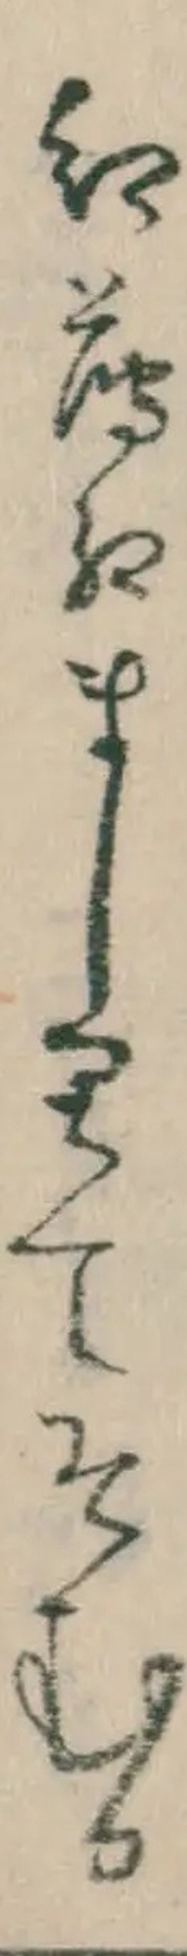紅薄紅ましりてそむる
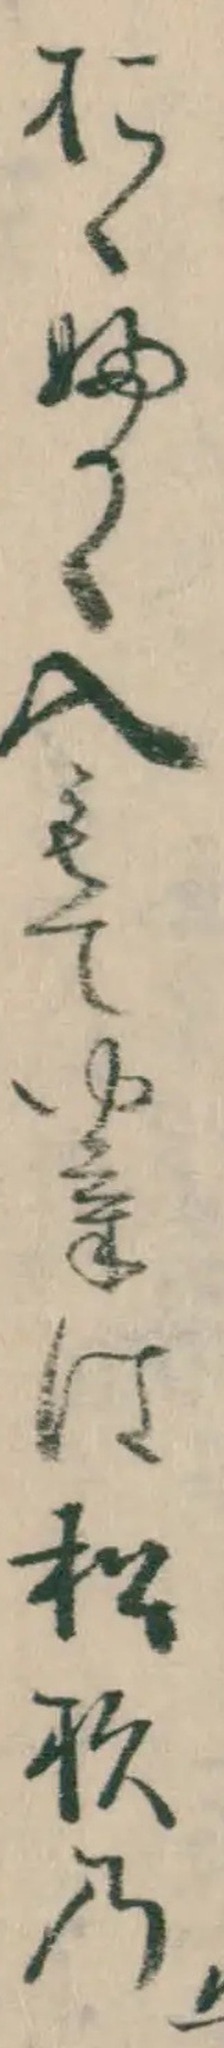おくふかく入もてゆけば松杉の
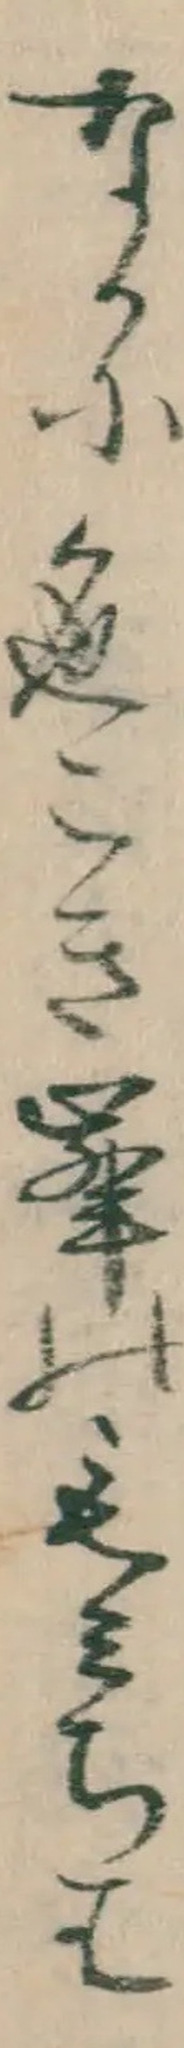なかに色こき峯のもみちは

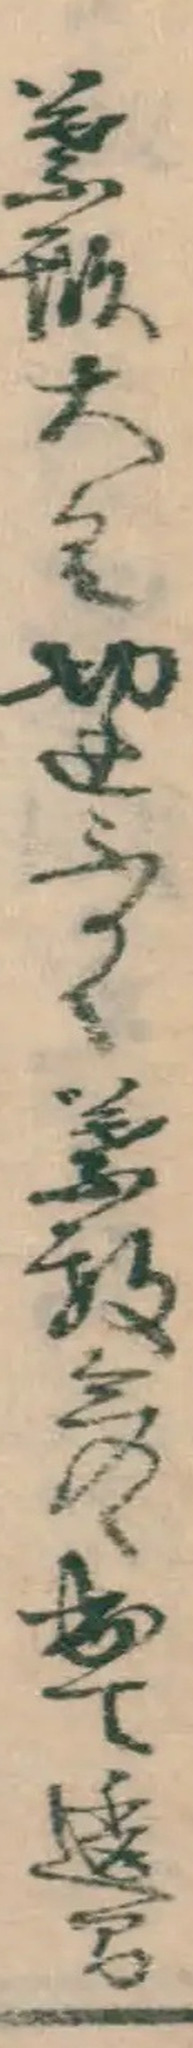軒端葉形大く切込ふかく葉数多く出て透間
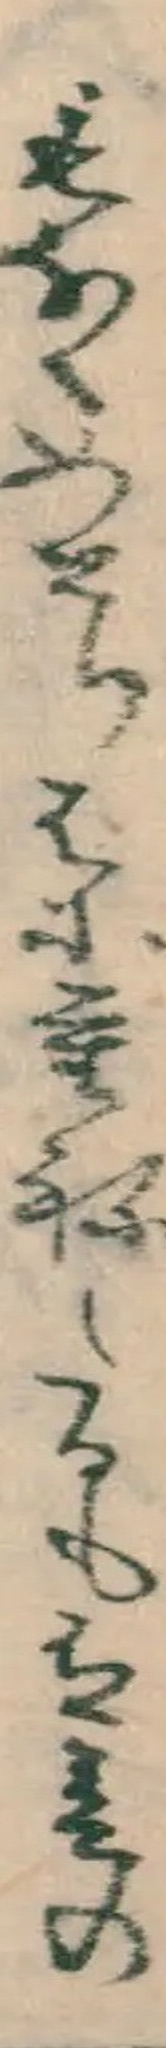もなくめとりはに重ねたるも有春の
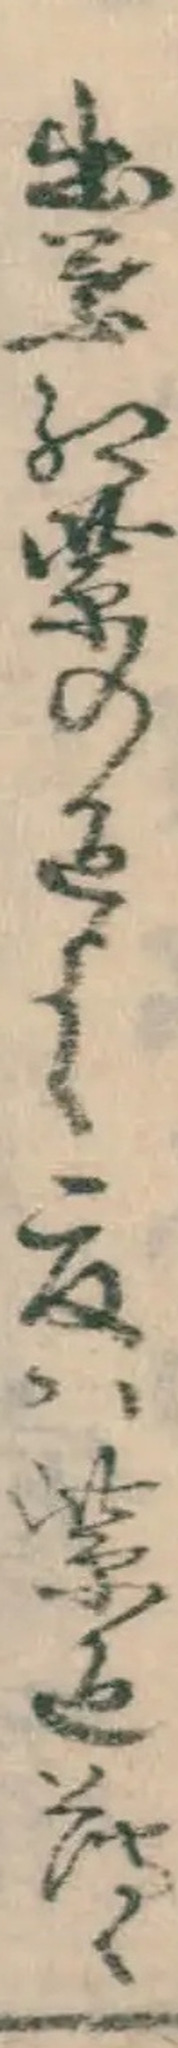出葉紅葉の色よく夏は紫色薄く
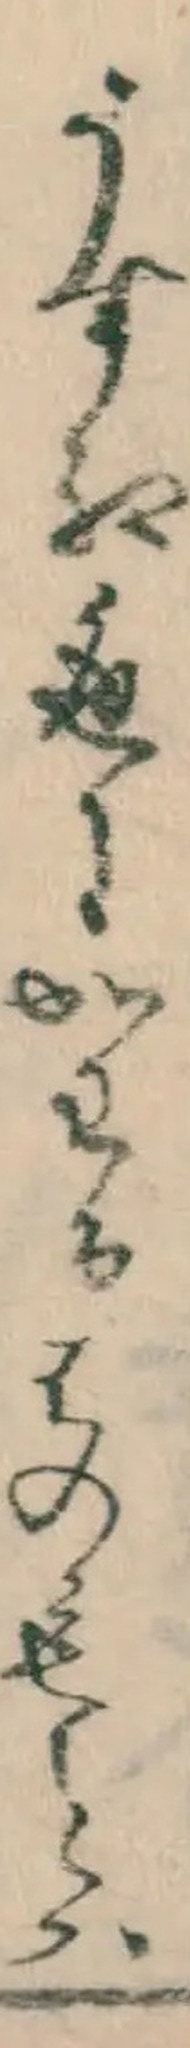うす紅色にかわるはのもとは
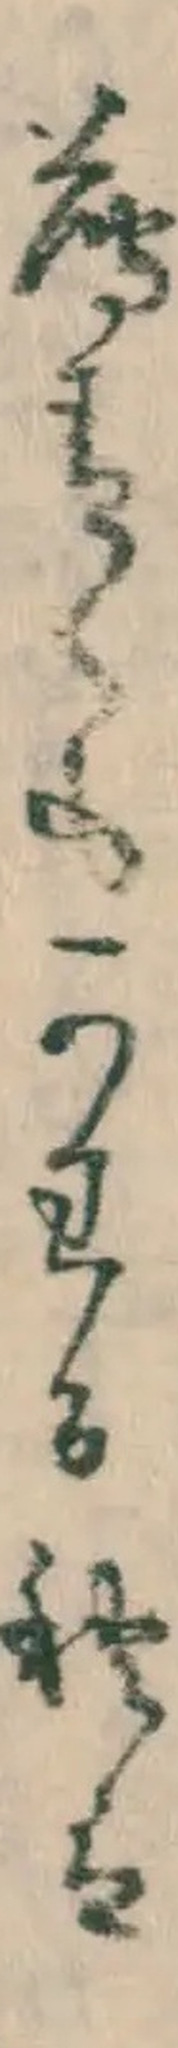薄青くもかわる秋は
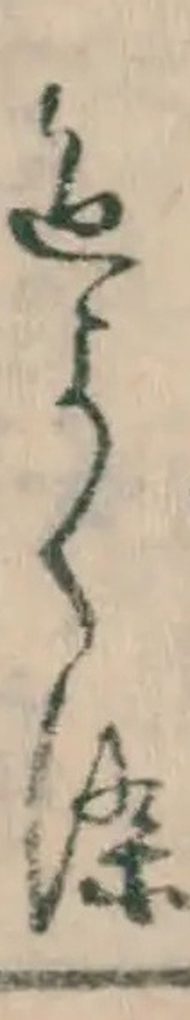色よく染
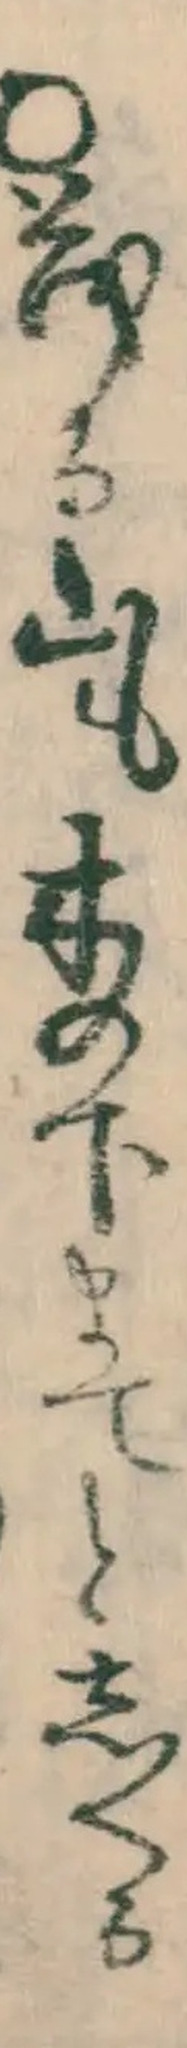○もる山も木の下まてとしくる
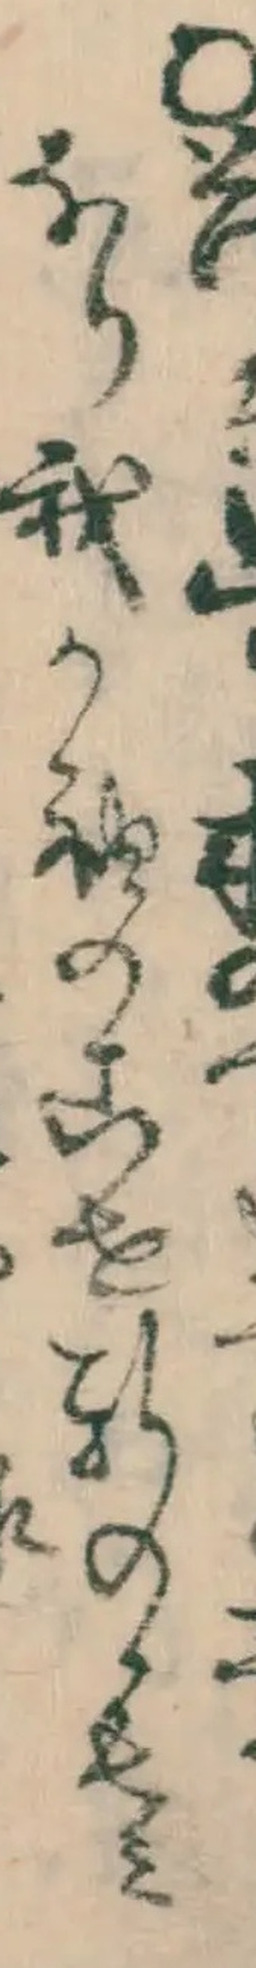なり我か袖のこせ軒のもみ
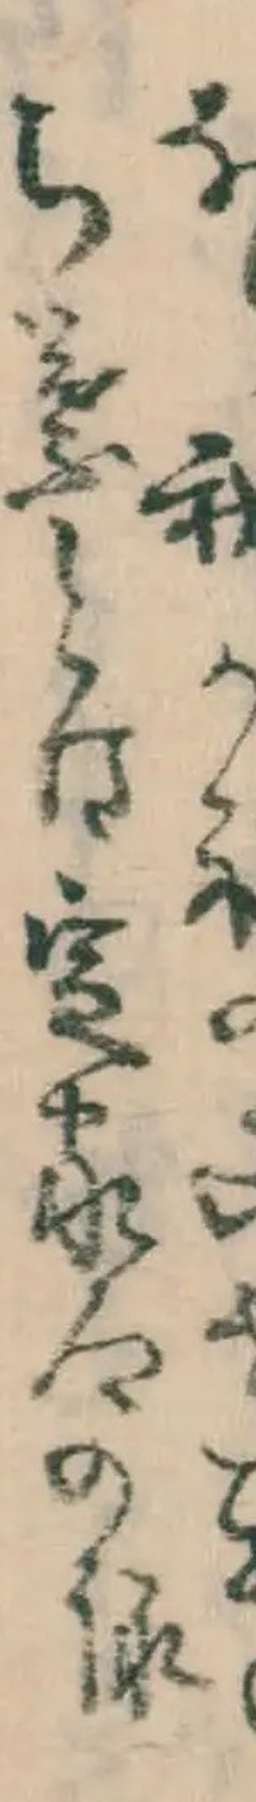ち葉とは定家卿の詠
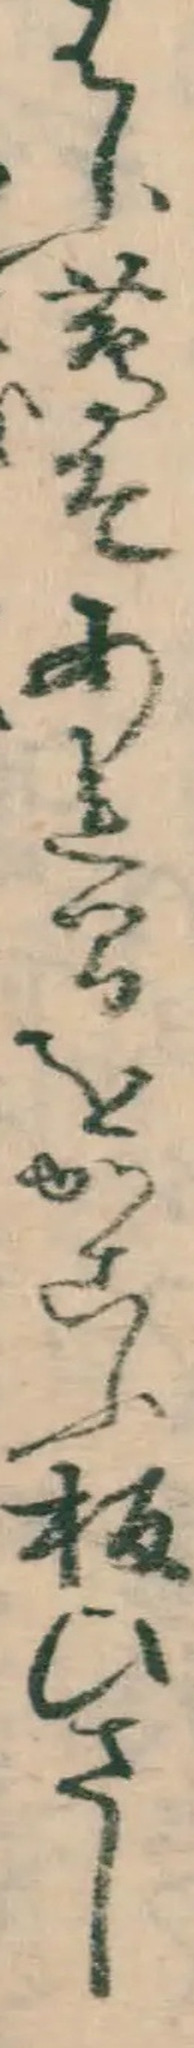はふ蔦そあれ間をかこふ板ひさし
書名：紅葉集
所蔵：国立国会図書館 National Diet Library, JAPAN
